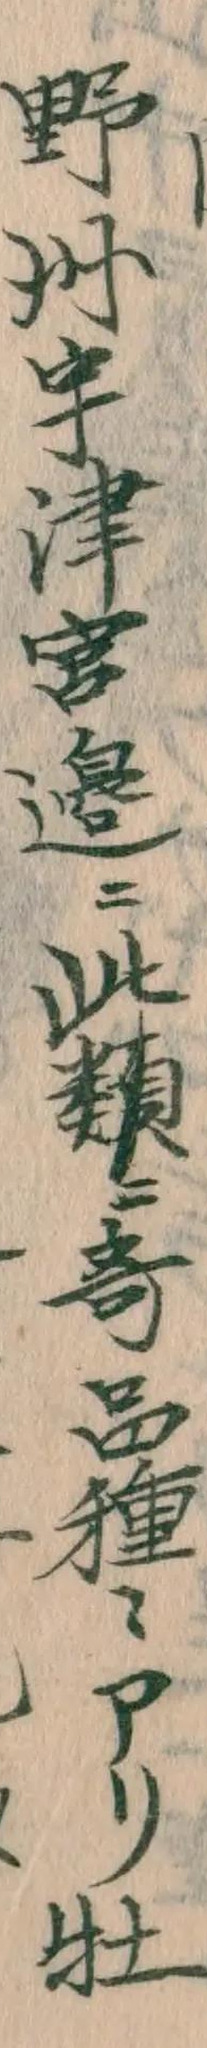野州宇津宮辺ニ此類ニ奇品種々アリ牡
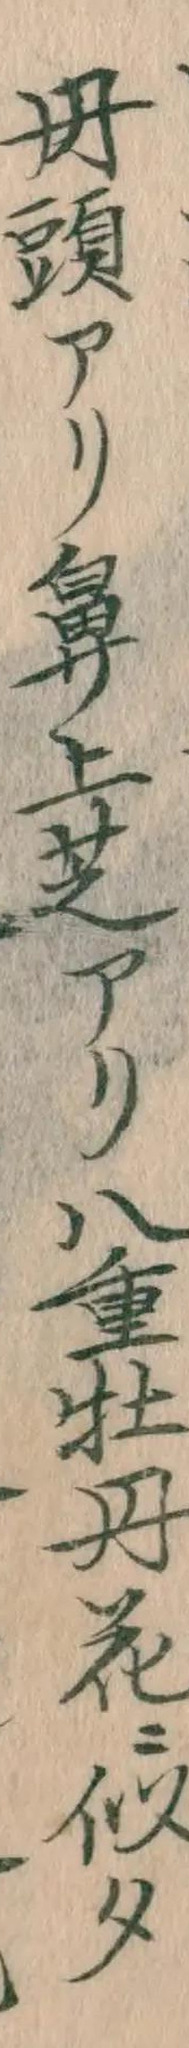丹頭アリ鼻上芝アリ八重牡丹花ニ似タ
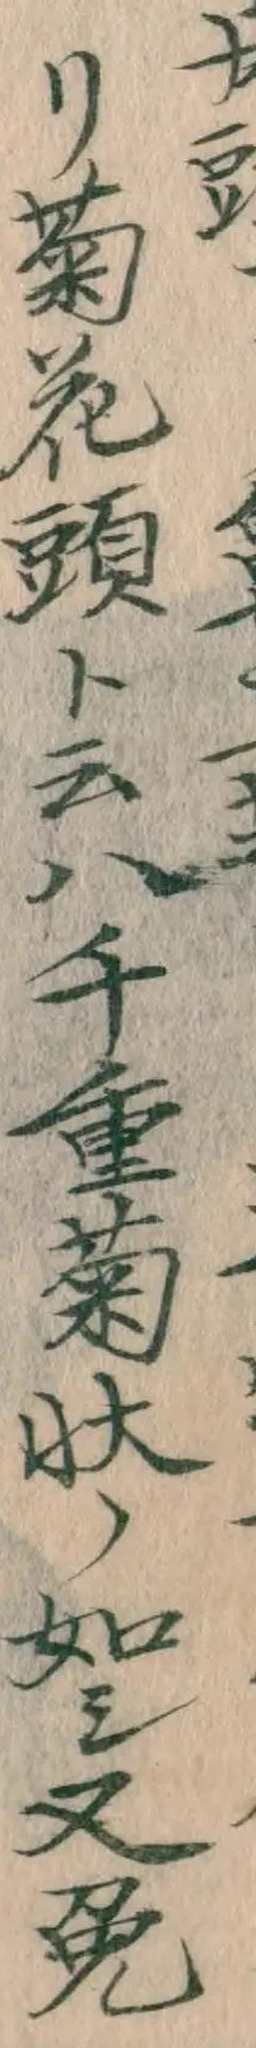リ菊花頭ト云八千重菊状ノ如シ又兎
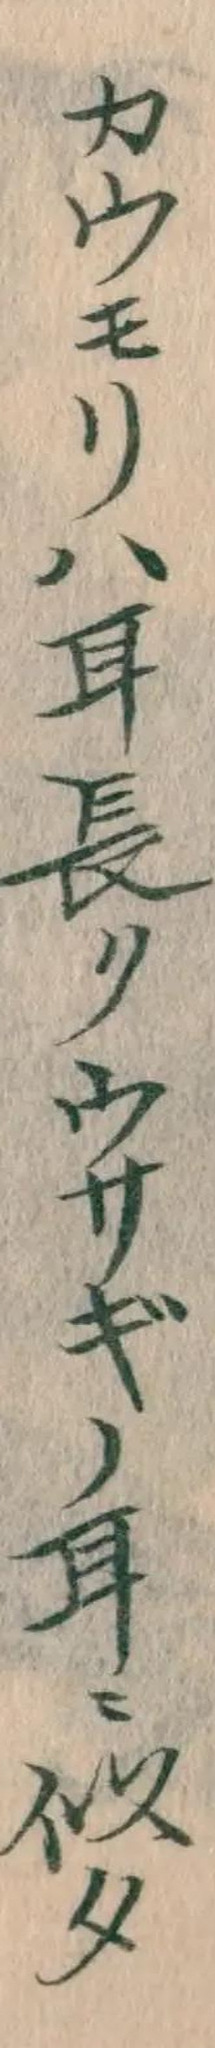カウモリハ耳長クウサギノ耳ニ似タ
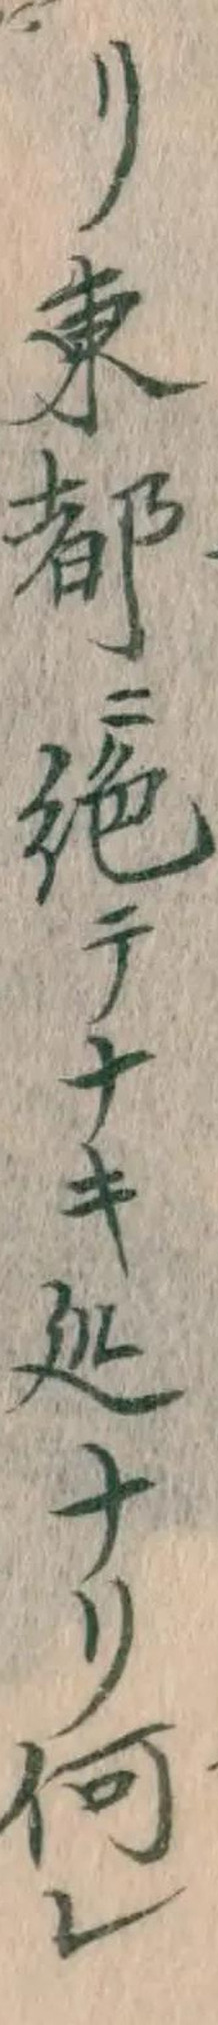リ東都ニ絶テナキ処ナリ何レ
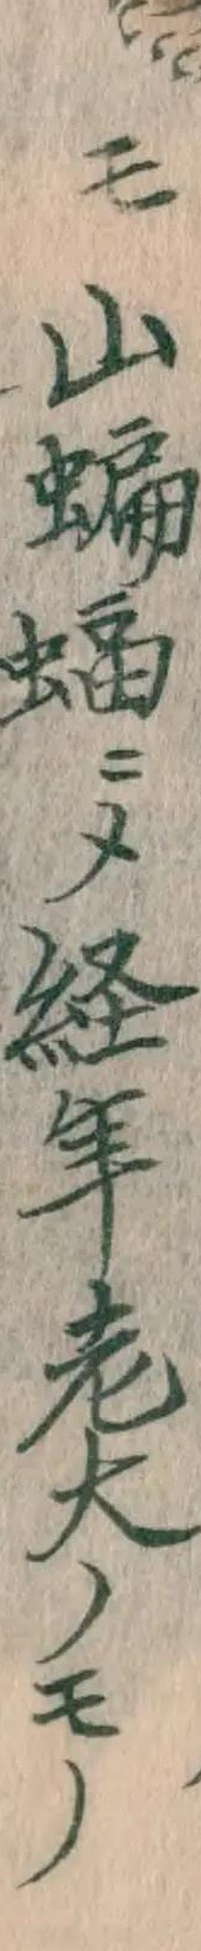モ山蝙蝠ニシテ経年老大ノモノ
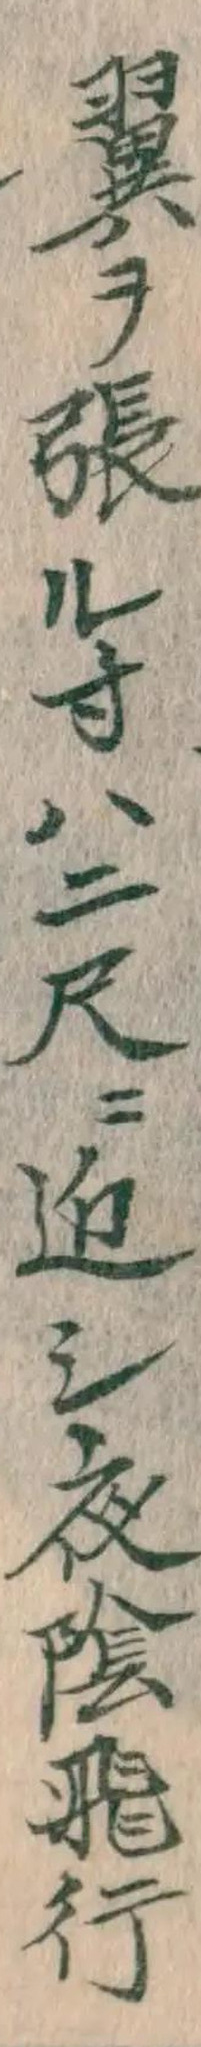翼ヲ張ル寸ハニ尺ニ近シ夜陰飛行
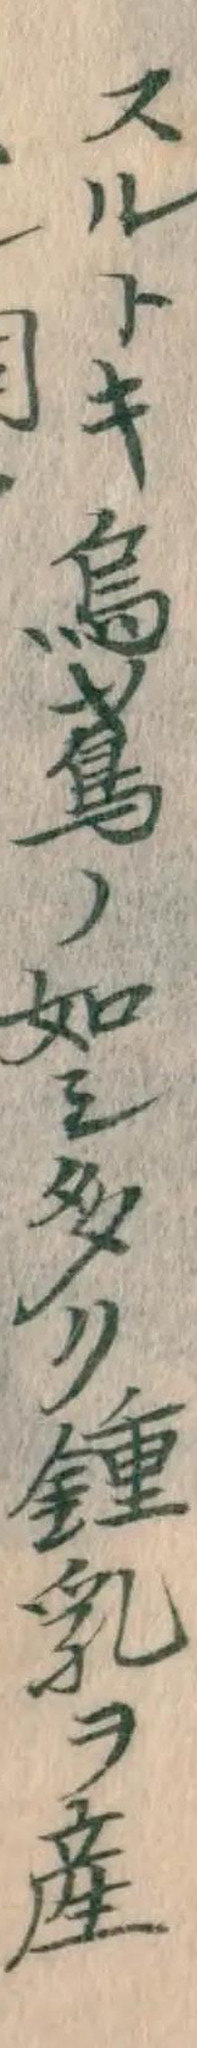スルトキ烏鳶ノ如シ多ク鍾乳ヲ産
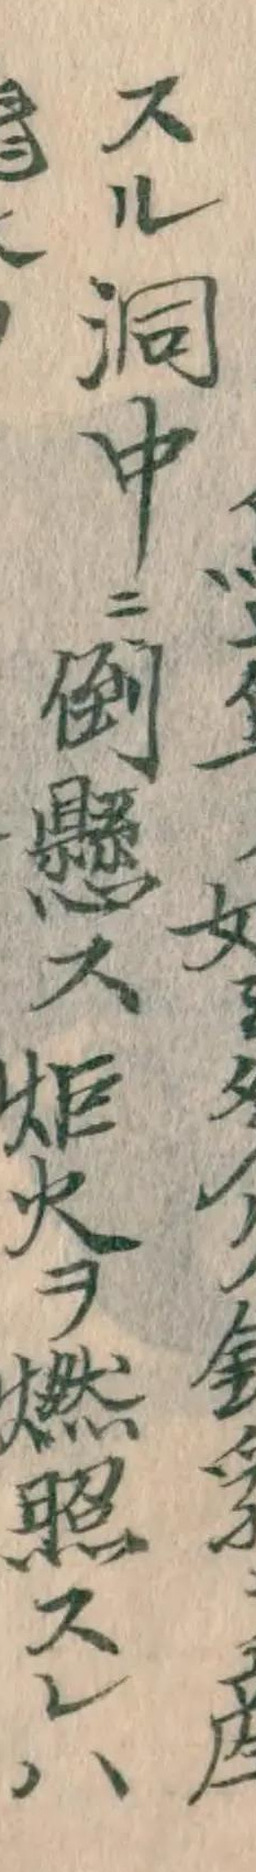スル洞中ニ倒懸ス炬火ヲ燃照スレハ
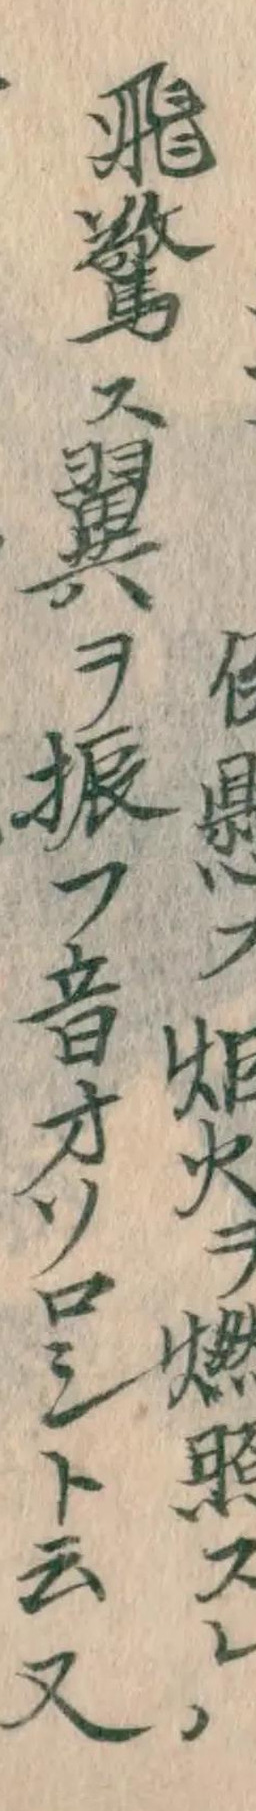飛驚ス翼ヲ振フ音オソロシト云又
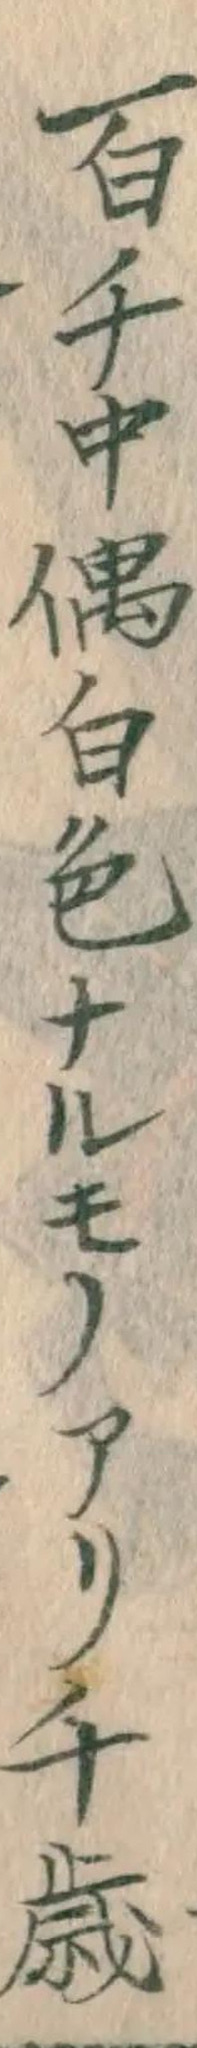百千中偶白色ナルモノアリ千歳
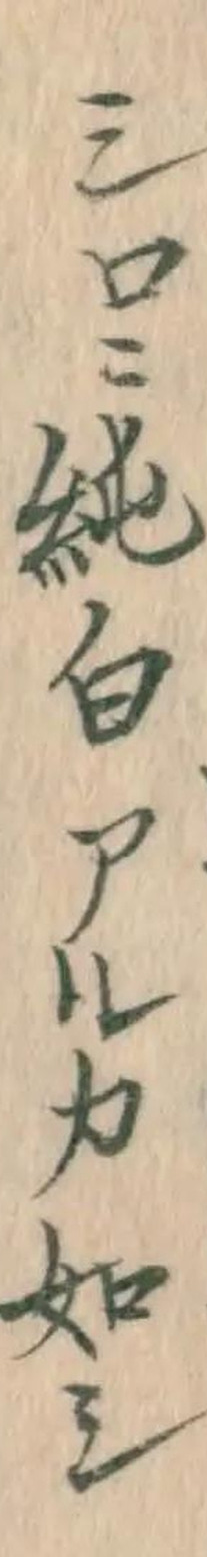シロニ純白アルカ如シ

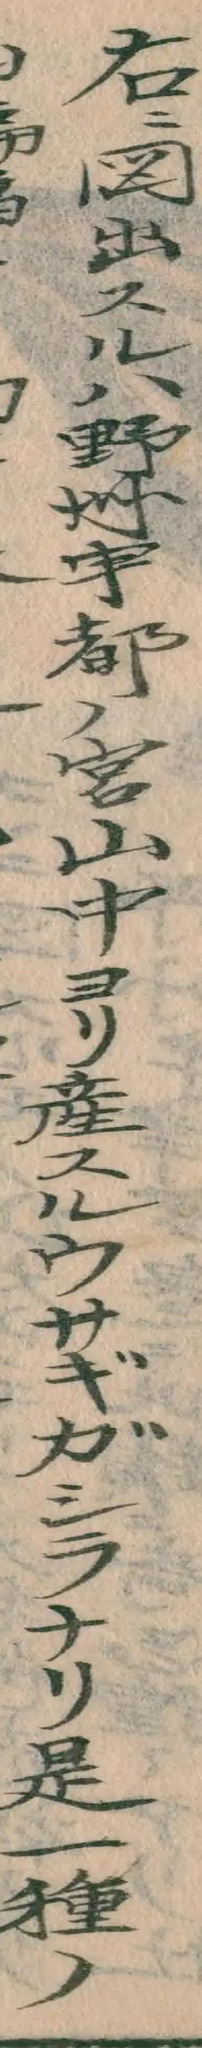右ニ図出スルハ野州宇都ノ宮山中ヨリ産スルウサギガシラナリ是一種ノ
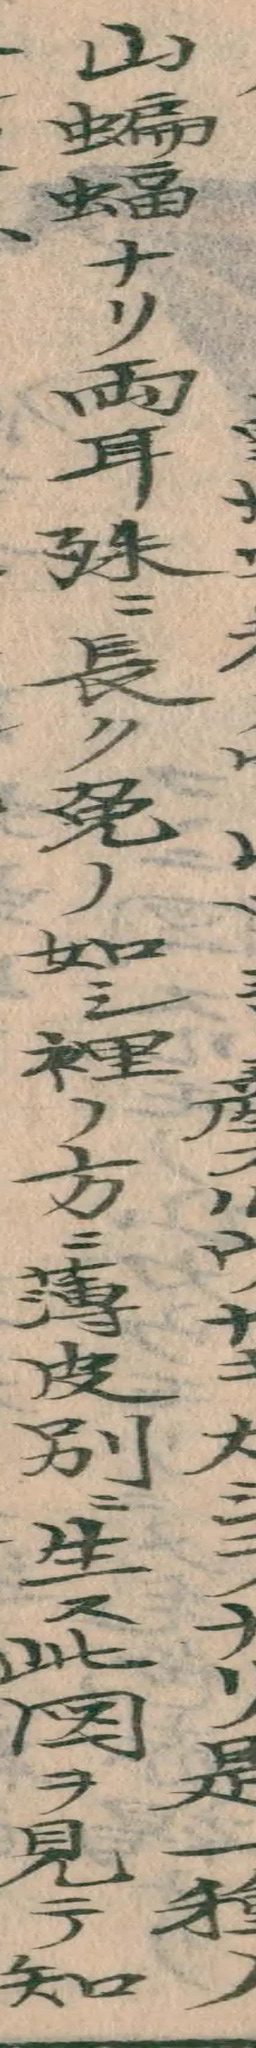山蝙蝠ナリ両耳殊ニ長ク兎ノ如シ裡ノ方ニ薄皮別ニ生ス此図ヲ見テ知
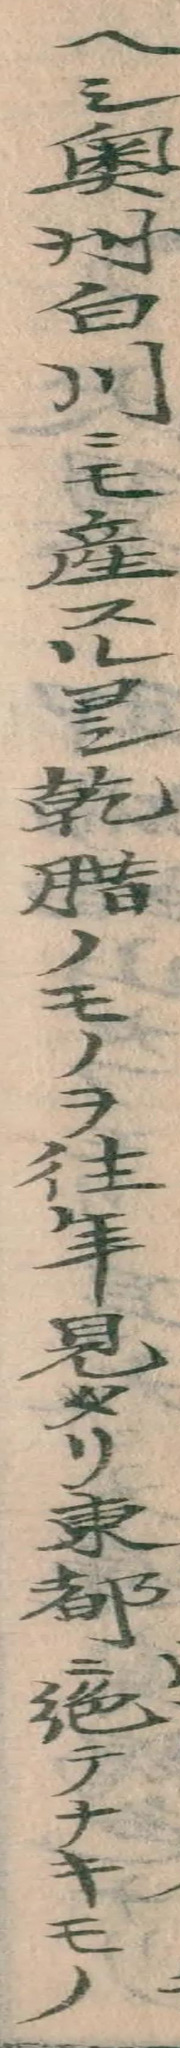ヘシ奥州白川ニモ産スルヨシ乾腊ノモノヲ往年見タリ東都ニ絶テナキモノ

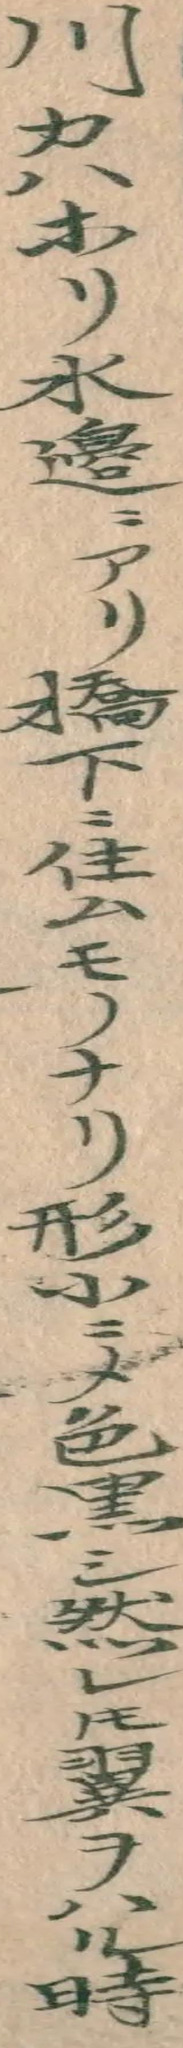川カハホリ水辺ニアリ橋下ニ住ムモノナリ形小ニシテ色黒シ然レトモ翼ヲハル時
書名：千蟲譜 3巻. [3]
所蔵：国立国会図書館 National Diet Library, JAPAN
